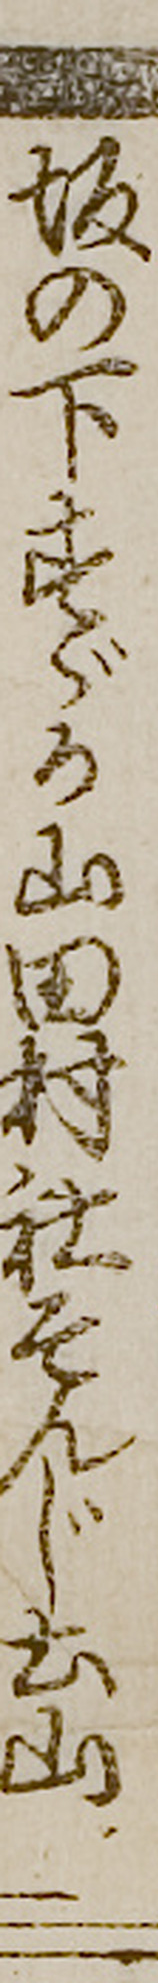坂の下すゞか山田村社そんじ土山
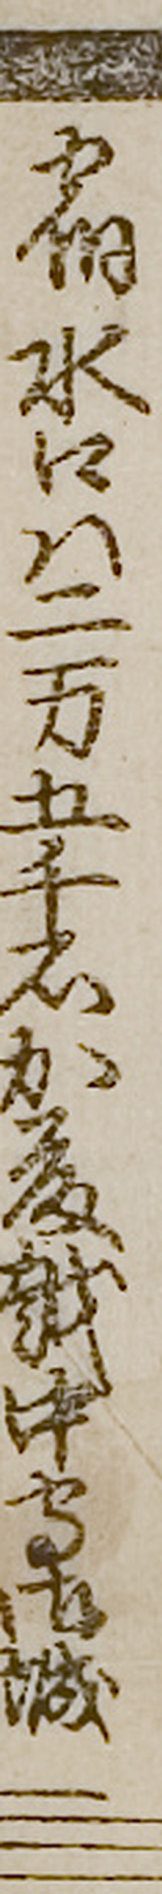宿水口は二万五千石加藤越中守御城
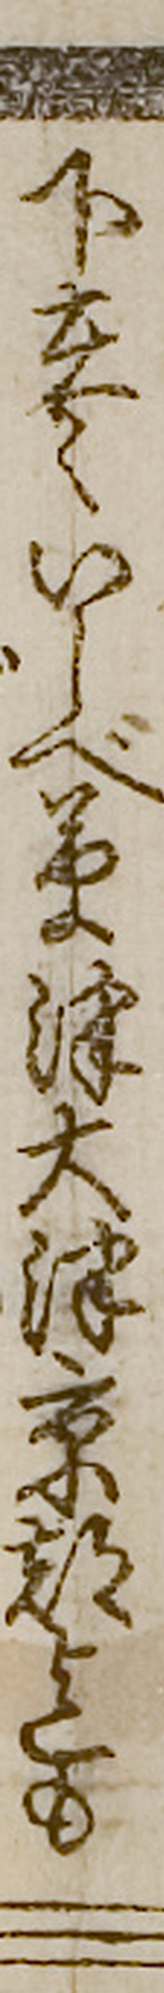下在々いしべ草津大津京都迄も
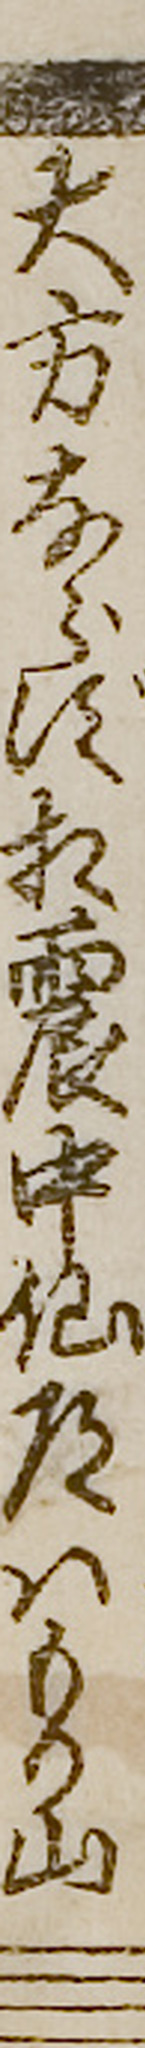大方ならず相震中仙道はもり山
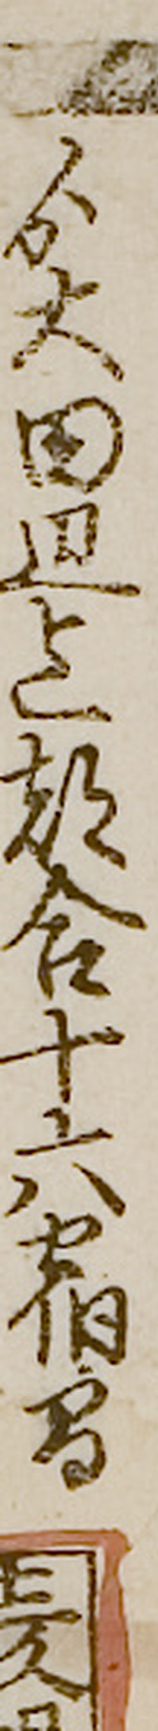より太田辺迄都合十六宿間
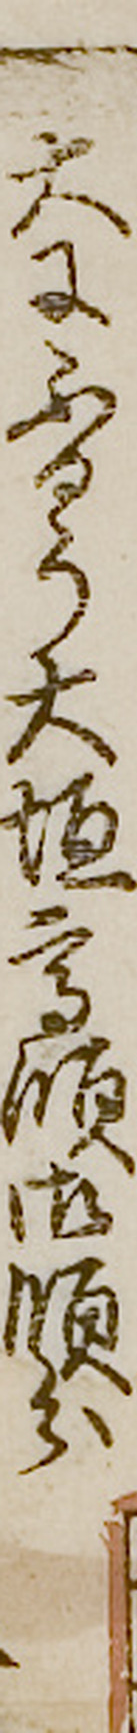大にふるう大垣高領御領分
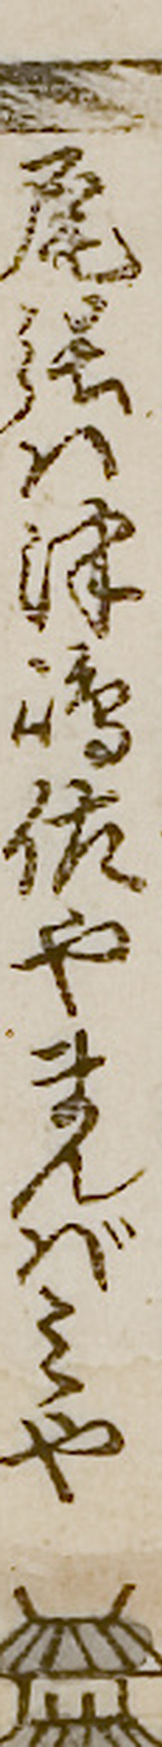尾張は津嶋佐やまんばみや
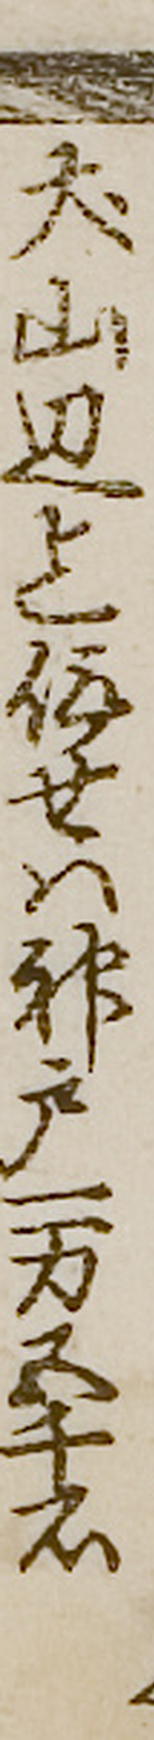犬山辺迄伊せは神戸一万五千石
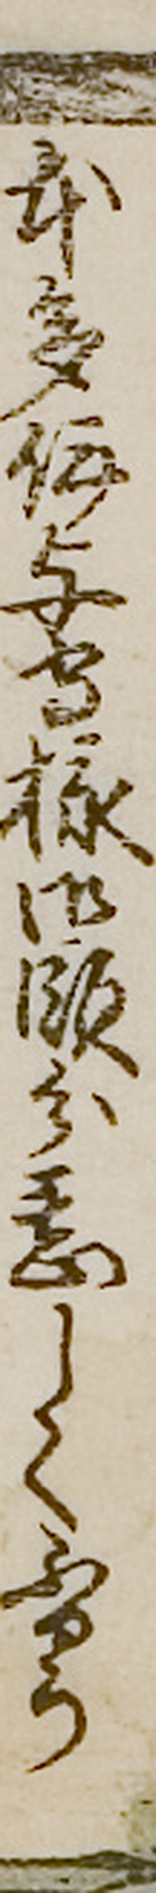本多伊与守様御領分甚しくふるう
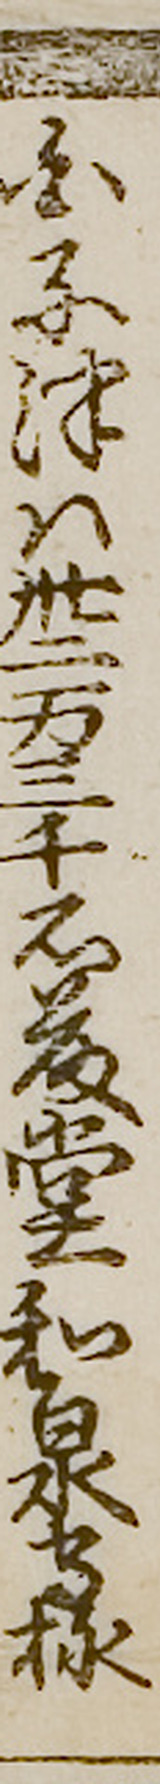白子津は卅二万三千石藤堂和泉守様
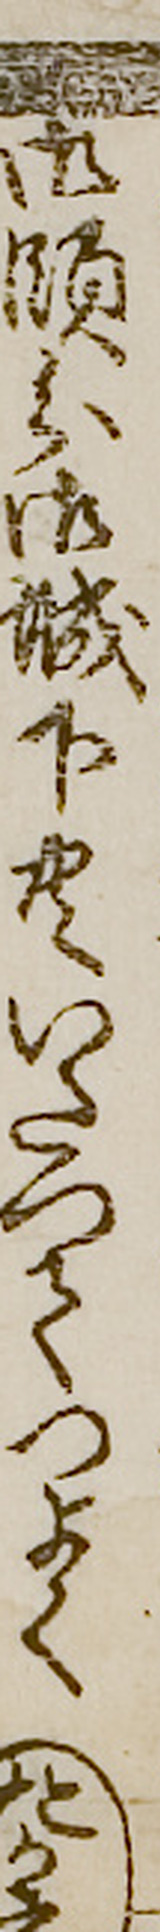御領分御城下共いたつてつよく
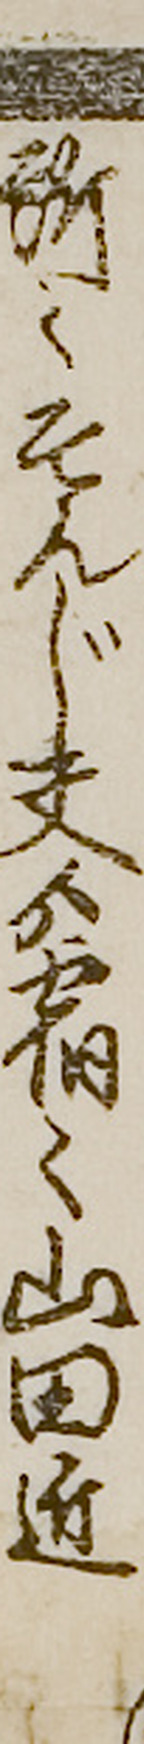所々そんじ夫より宿々山田近
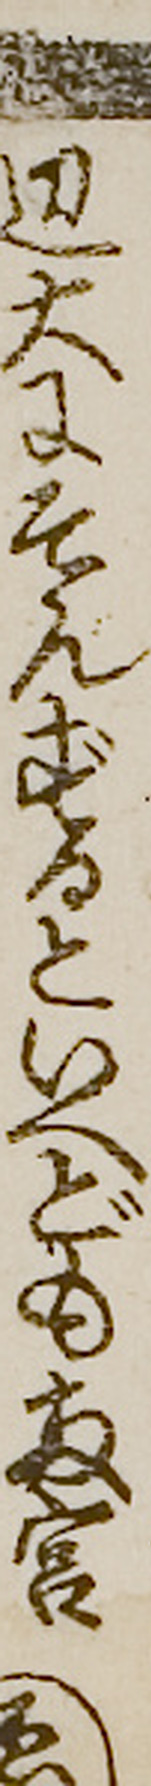辺大にそんずるといへども両宮
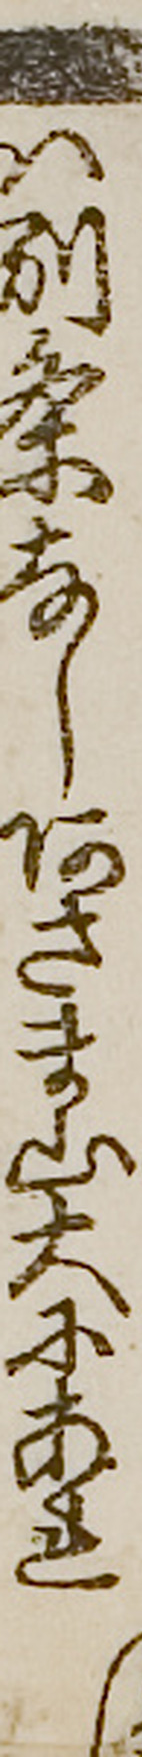は別条なしあさま山大にあれ
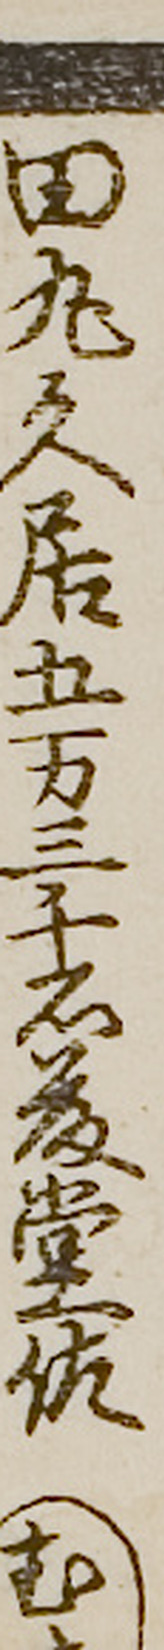田丸久居五万三千石藤堂佐
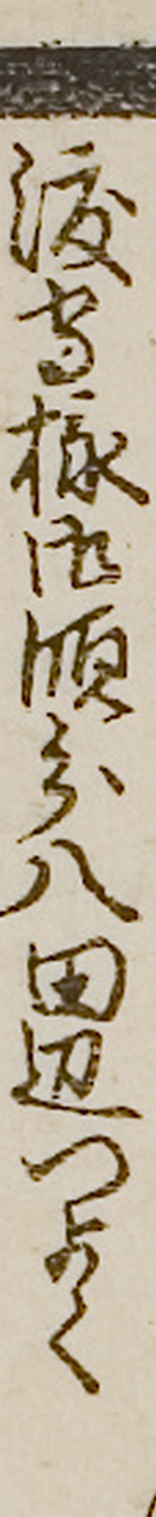渡守様御領分八田辺つよく
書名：伊勢伊賀志摩近江尾張美濃大地震の図
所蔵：東京大学総合図書館 General Library in the University of Tokyo, JAPAN
